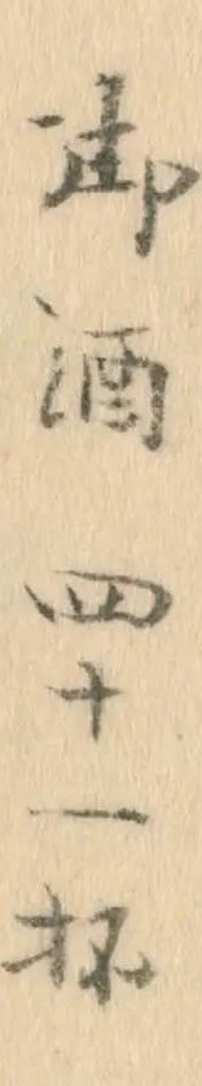御酒四十一杯
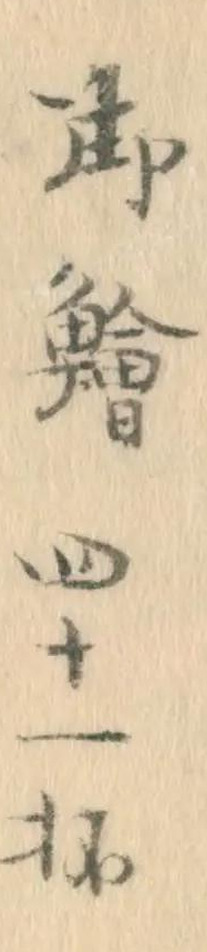御鱠四十一杯

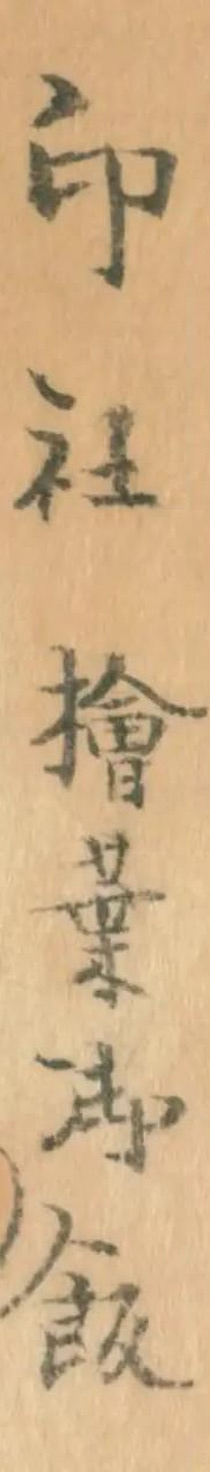印社檜葉御飯
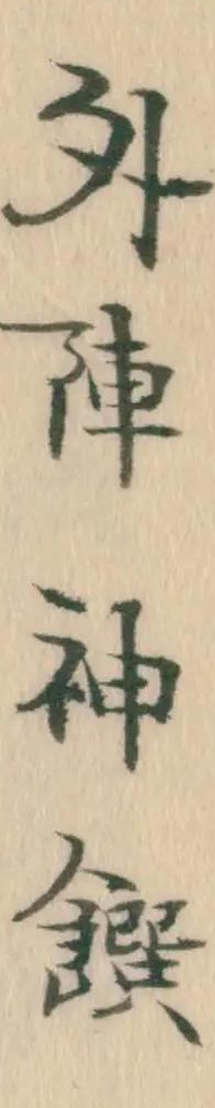外陣神饌
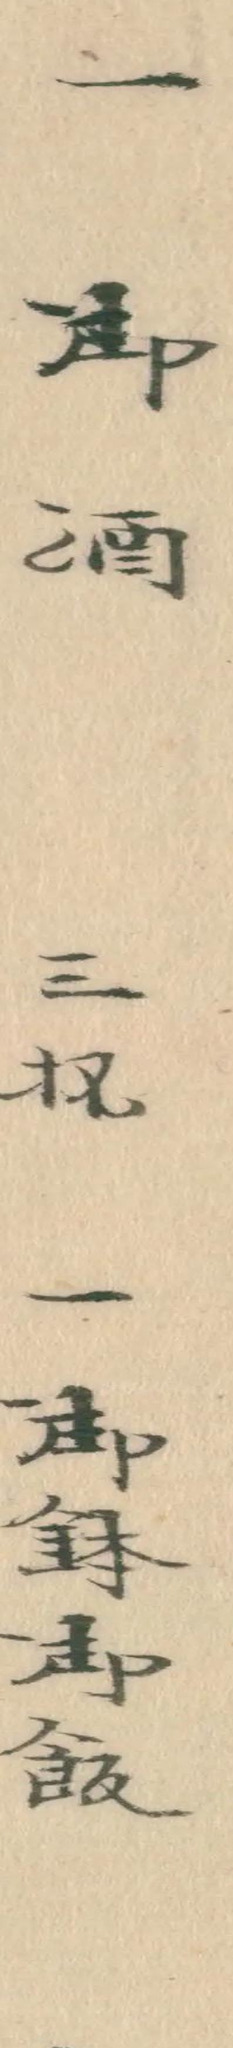一御酒三杯一御鉢御飯十杯
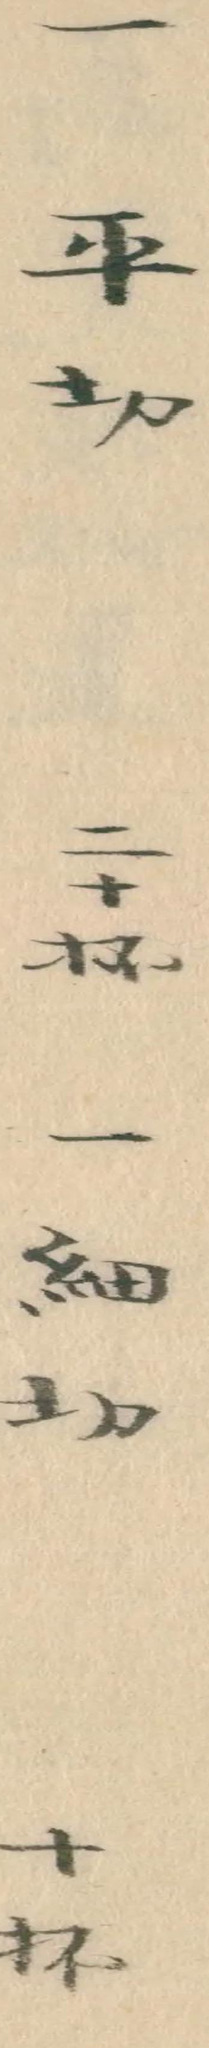一平切二十杯一細切十杯
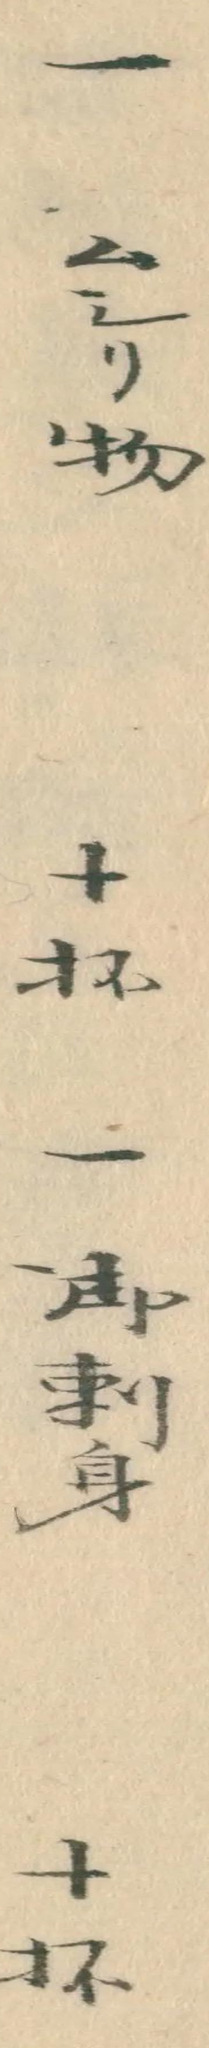一ムシリ物十杯一御刺身十杯
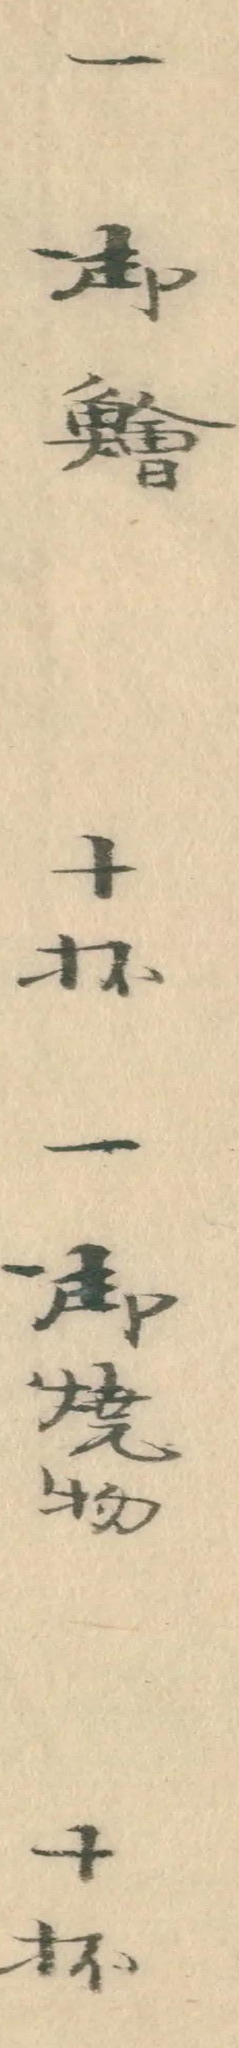一御鱠十杯一御焼物十杯
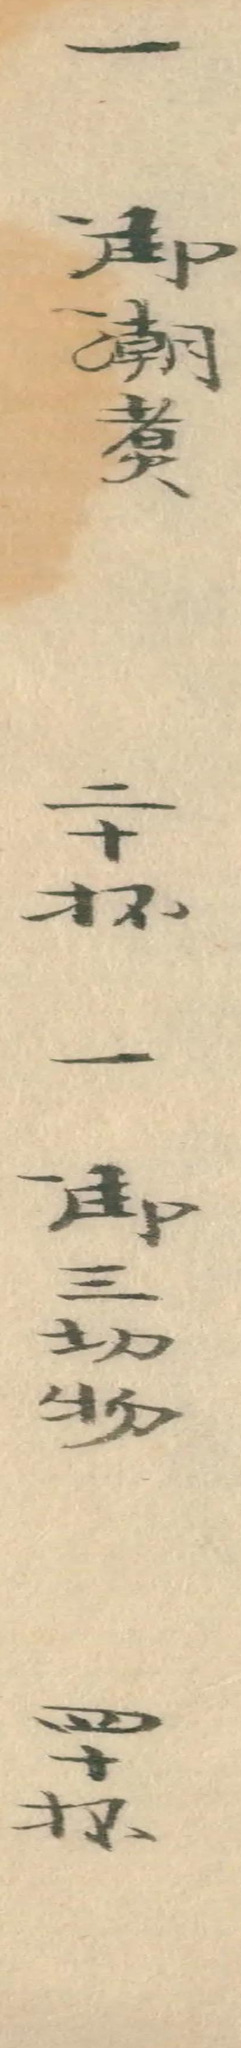一御潮煮二十杯一御三切物四十杯
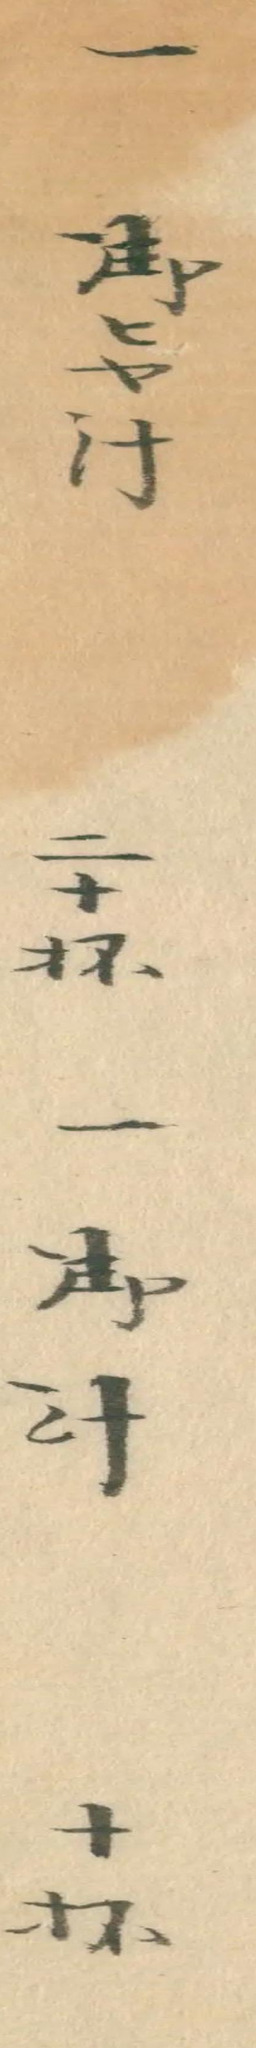一御ヒヤ汁二十杯一御汁十杯

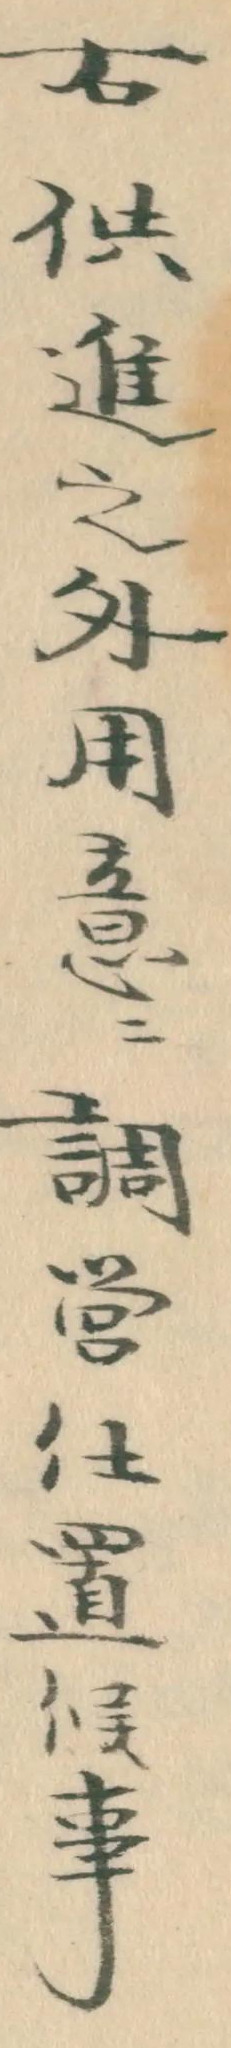右供進之外用意ニ調営仕置候事
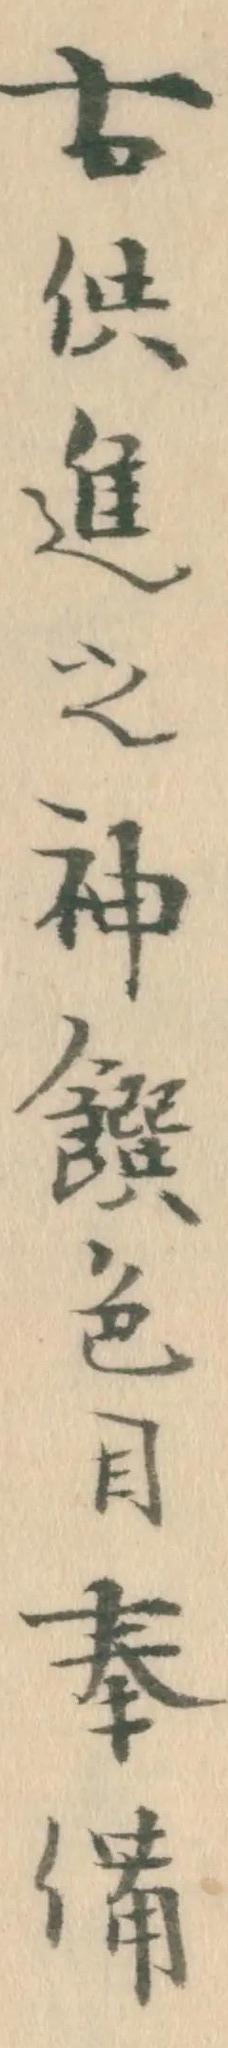右供進之神饌色目奉備
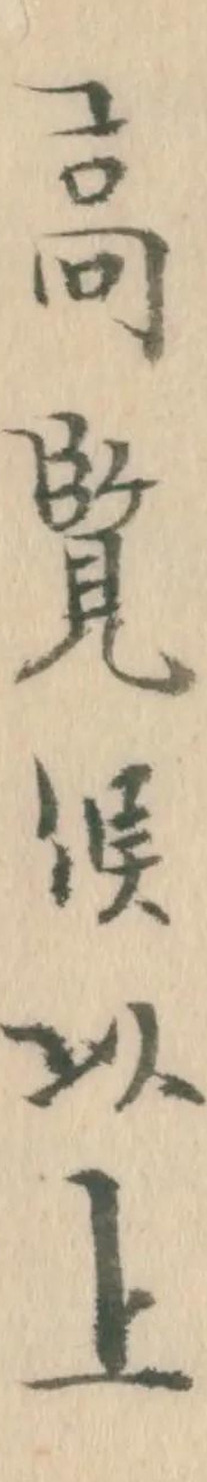高覧候以上
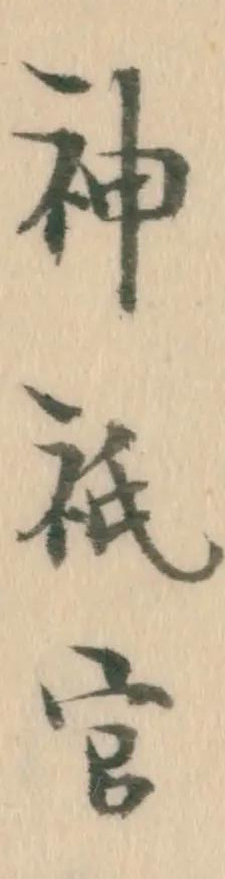神祇宮
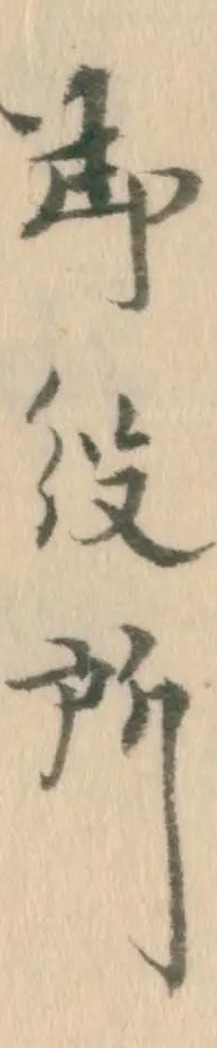御役所
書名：葵御祭供進之神饌諸品色目書
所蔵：国立国会図書館 National Diet Library, JAPAN
